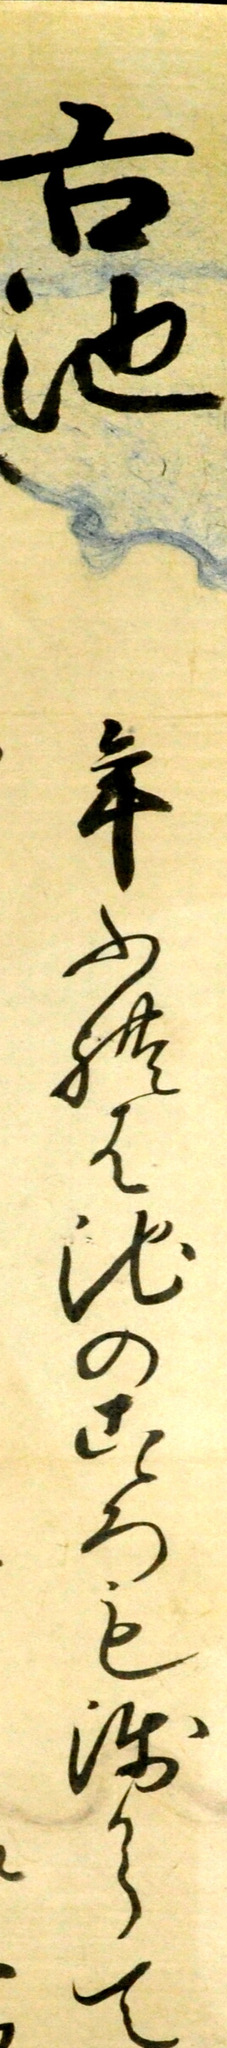年ふれは池のこゝろも浅からて
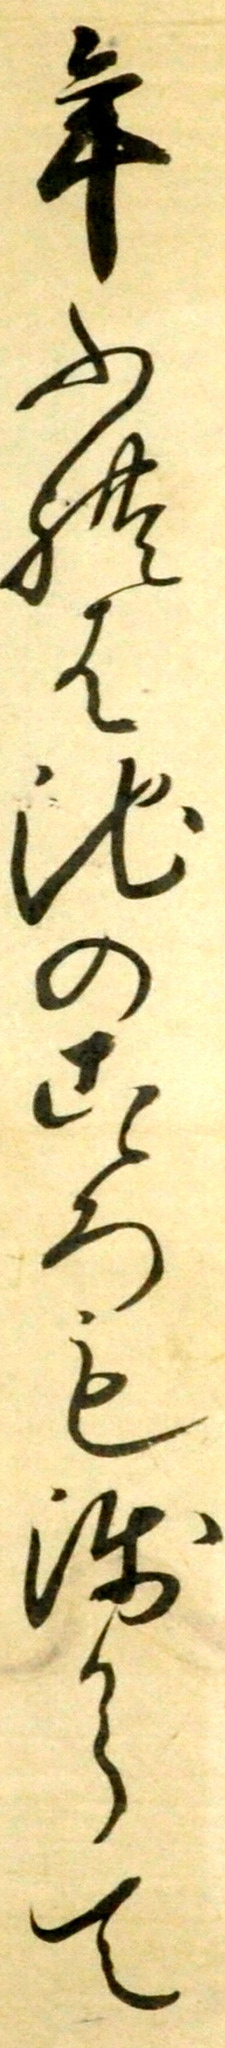年ふれは池のこゝろも浅からて
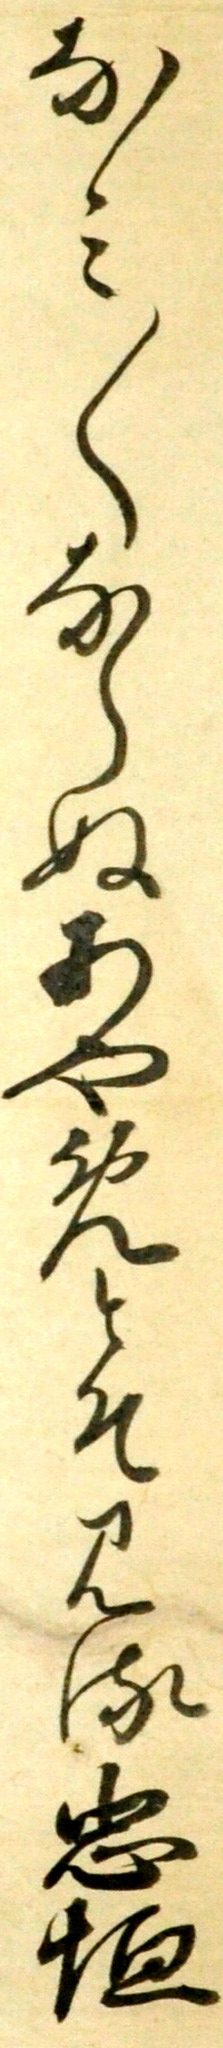なみ〳〵ならぬあやめとそ見る忠恒

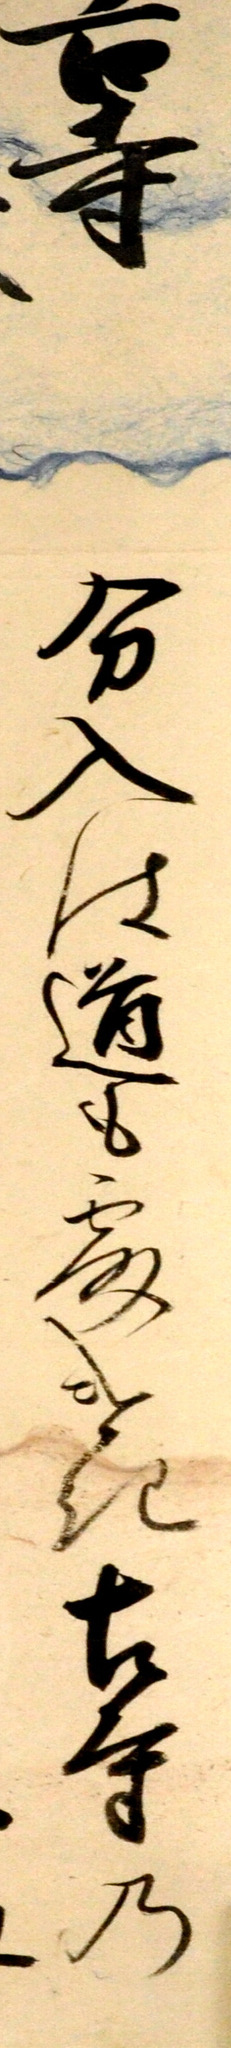分入は道も露けき古寺の
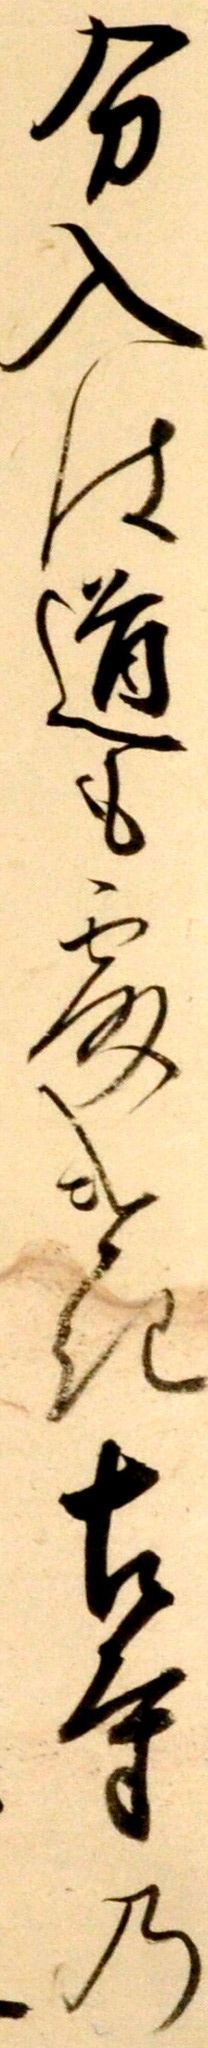分入は道も露けき古寺の
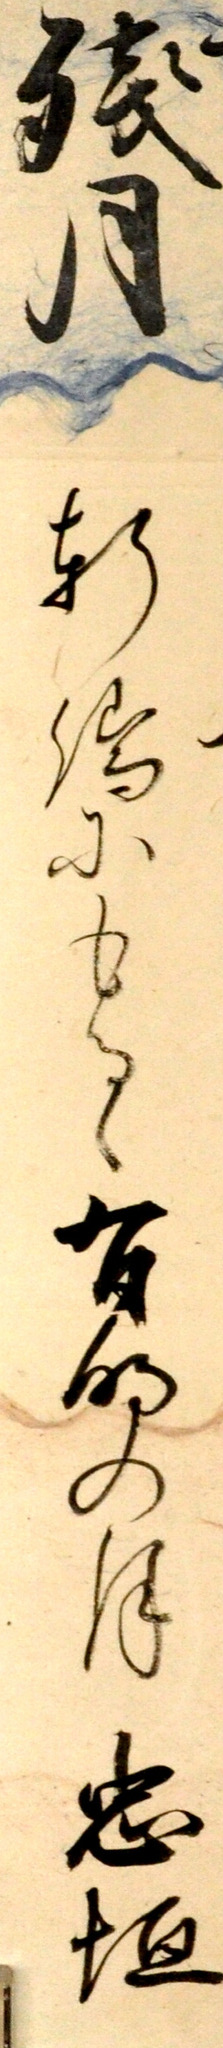軒端にもるゝ有明の月忠恒
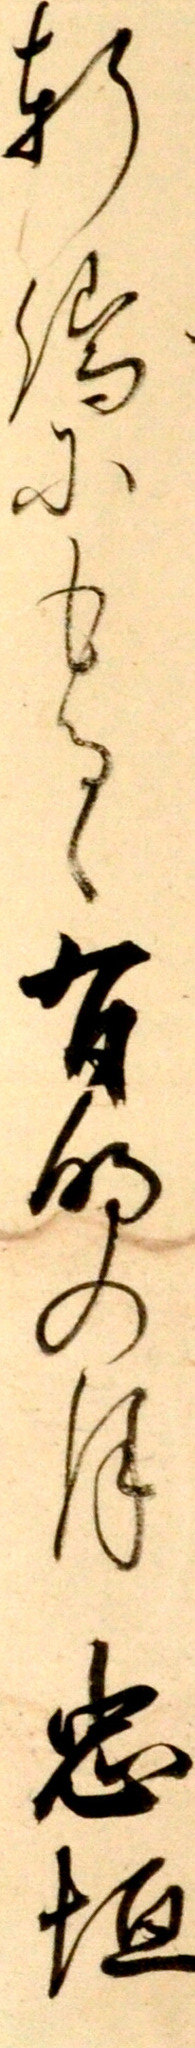軒端にもるゝ有明の月忠恒

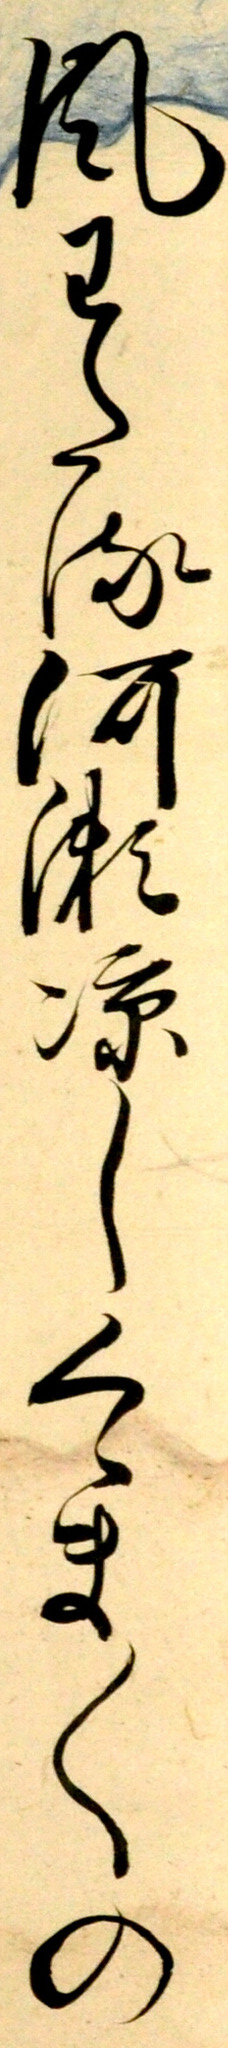風わたる河瀬涼しくゝま〳〵の
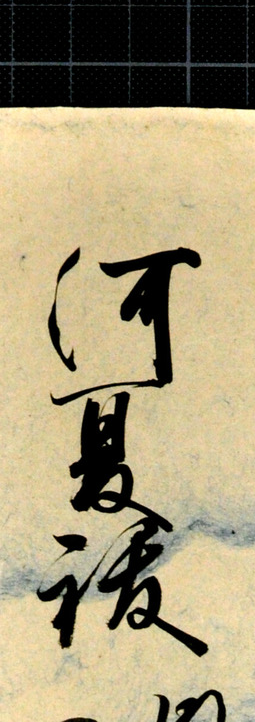河夏祓
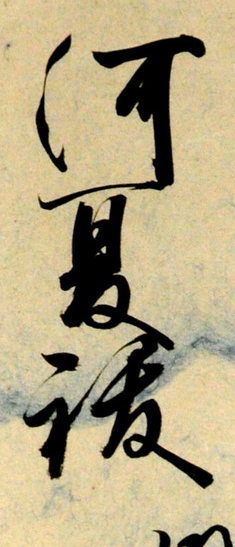河夏祓
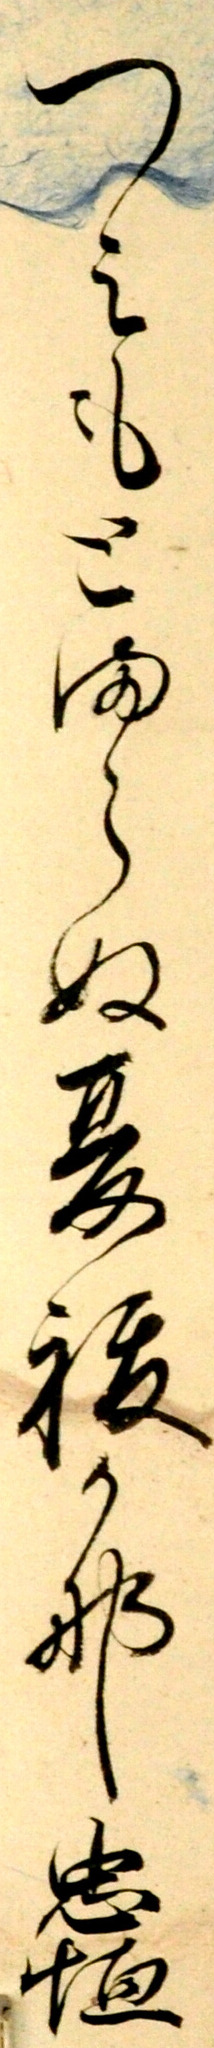つみもとまらぬ夏祓かな忠恒

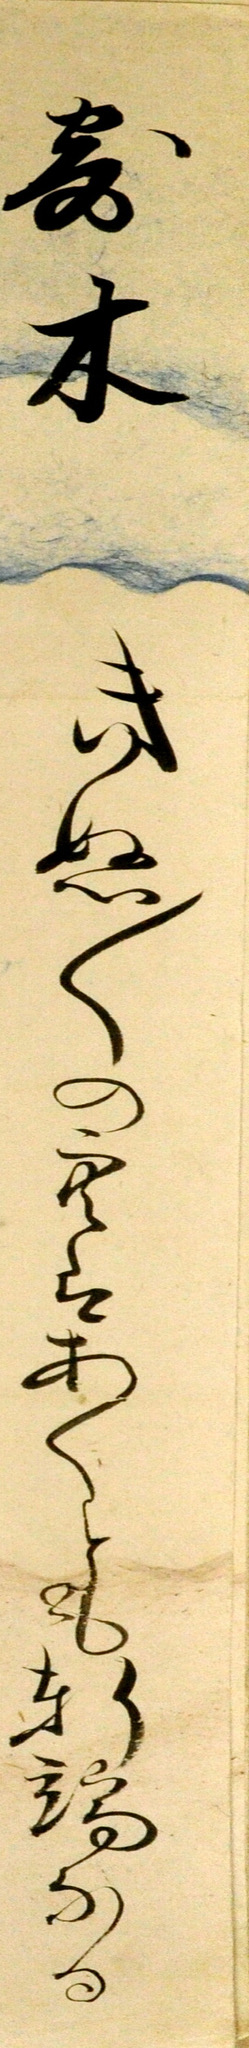きぬ〳〵の空はあくとも軒端なる
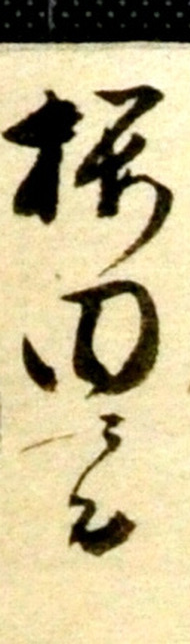桜田にて
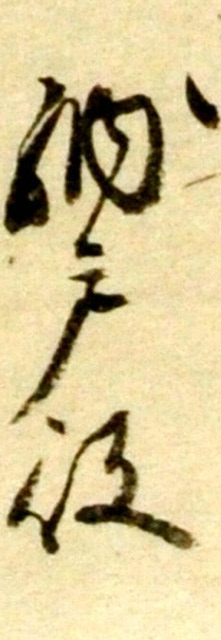納戸役
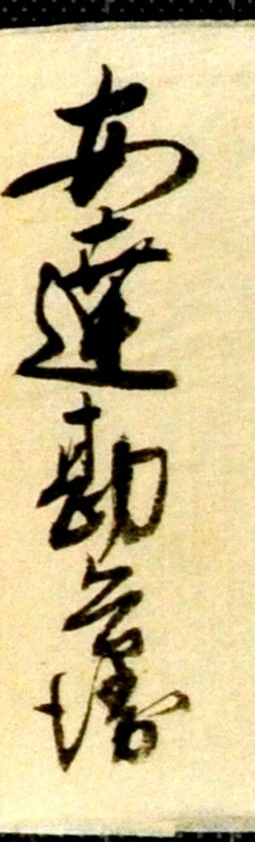安達勘兵衛

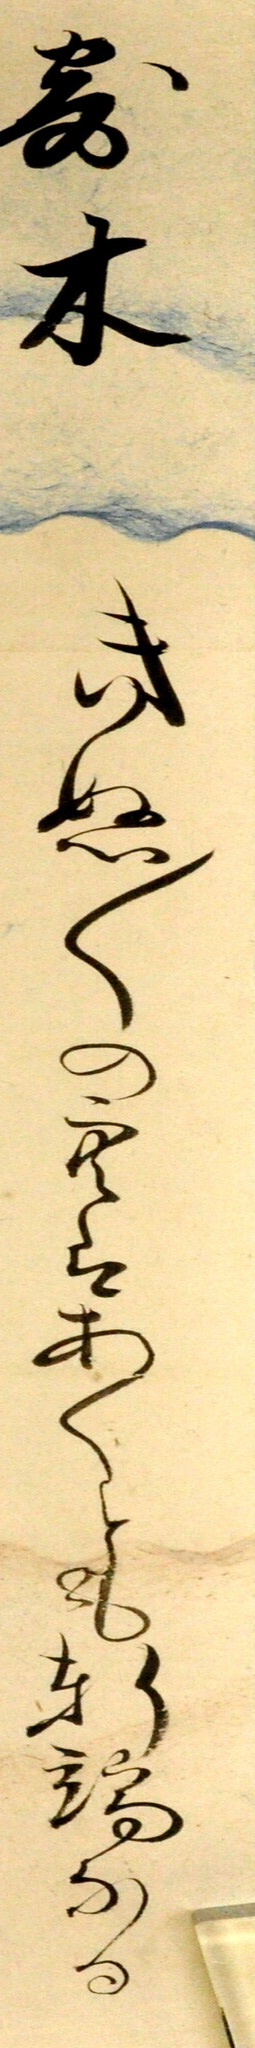きぬ〳〵の空はあくとも軒端なる
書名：短冊
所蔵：伊那市立高遠町図書館・合同会社AMANE
